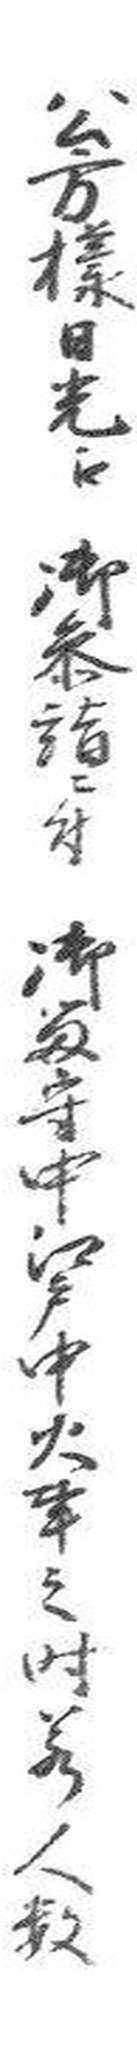公方様日光江御参詣ニ付御留守中江戸中火事之時若人数
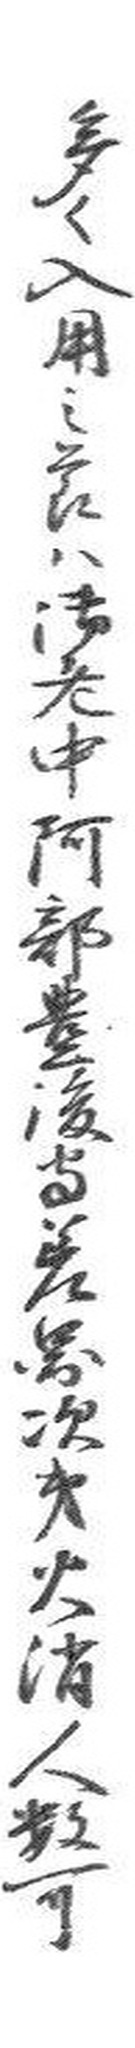多く入用之節ㇵ御老中阿部豊後守差図次第火消人数可
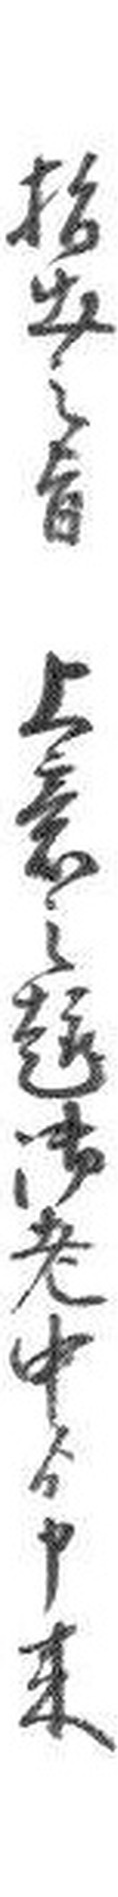指出之旨上意之趣御老中ゟ申来
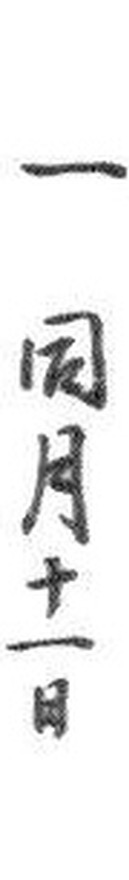一同月十一日
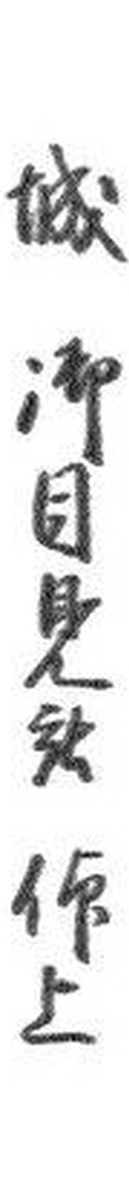城御目見被仰上
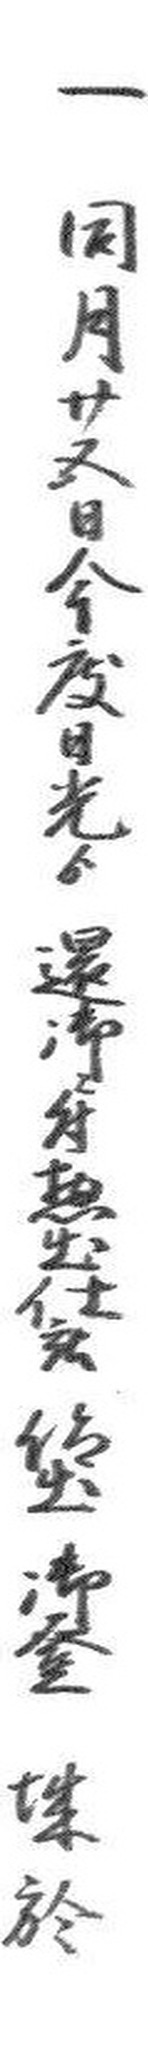一同月廿五日今度日光ゟ還御ニ付惣出仕被仰出御登城於
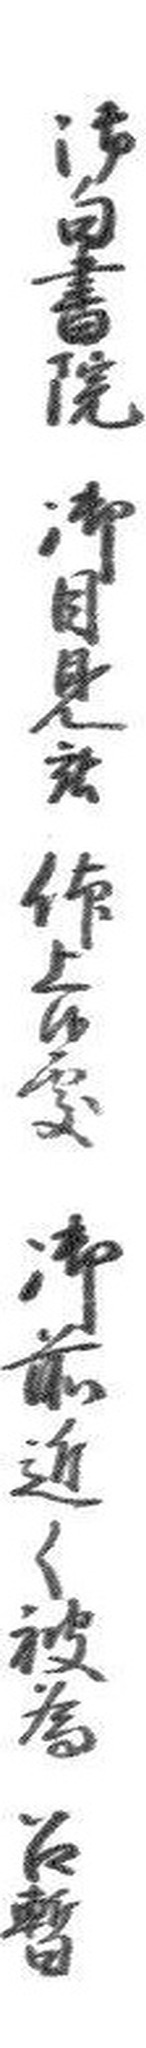御白書院御目見被仰上候処御前近く被為召暫
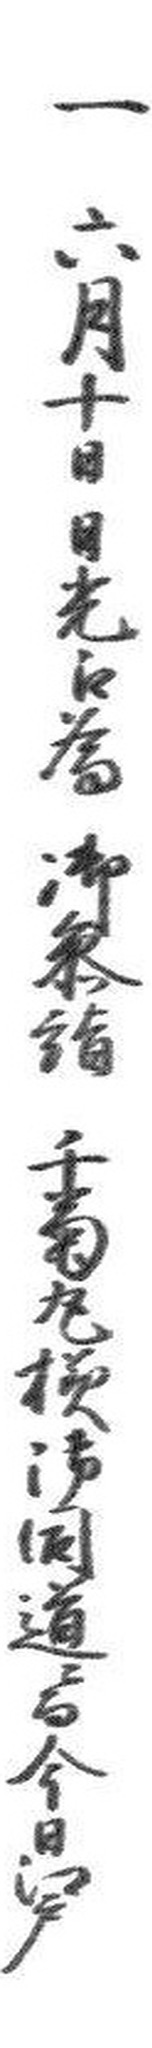一六月十日日光江為御参詣仙菊丸様御同道ニ而今日江戸
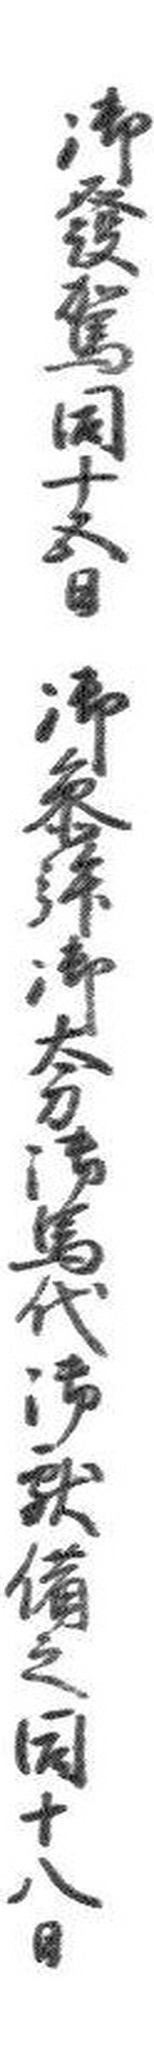御発駕同十五日御参拝御太刀御馬代御献備之同十八日

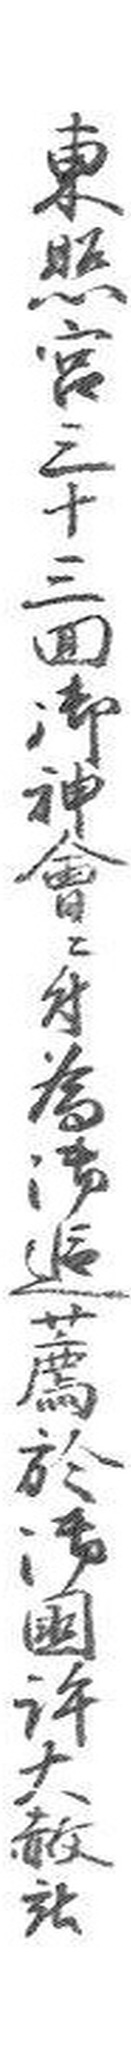東照宮三十三回御神会ニ付為御追薦於御国許大赦被
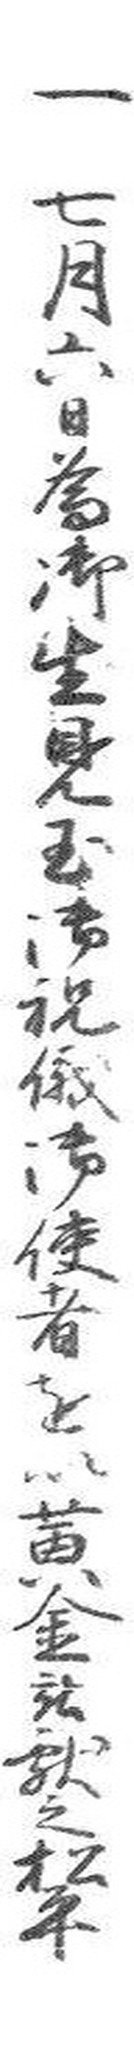一七月六日為御生見玉御祝儀御使者を以黄金被献之松平
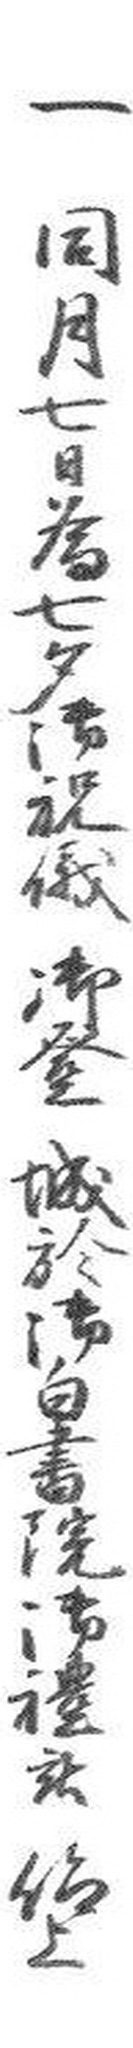一同月七日為七夕御祝儀御登城於御白書院御礼被仰上
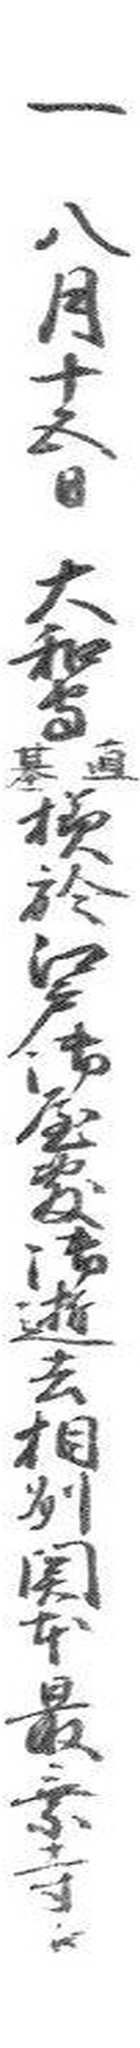一八月十五日大和守直基様於江戸御屋敷御逝去相州関本最乗寺江
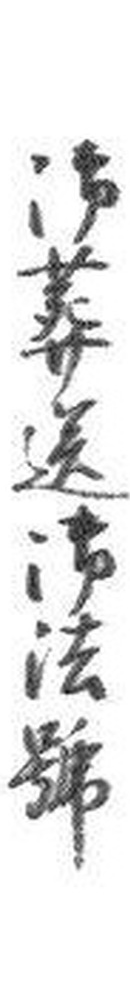御葬送御法号
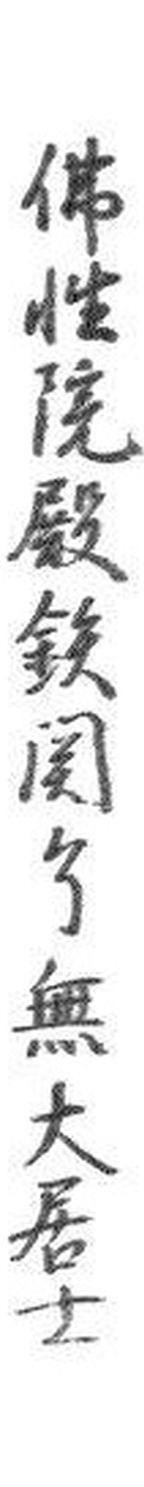仏性院殿鉄関了無大居士
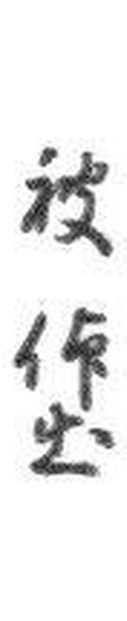被仰出
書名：家譜 五 光通公 従寛永十三年到万治二年
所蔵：福井県文書館 Fukui Prefectural Archives
